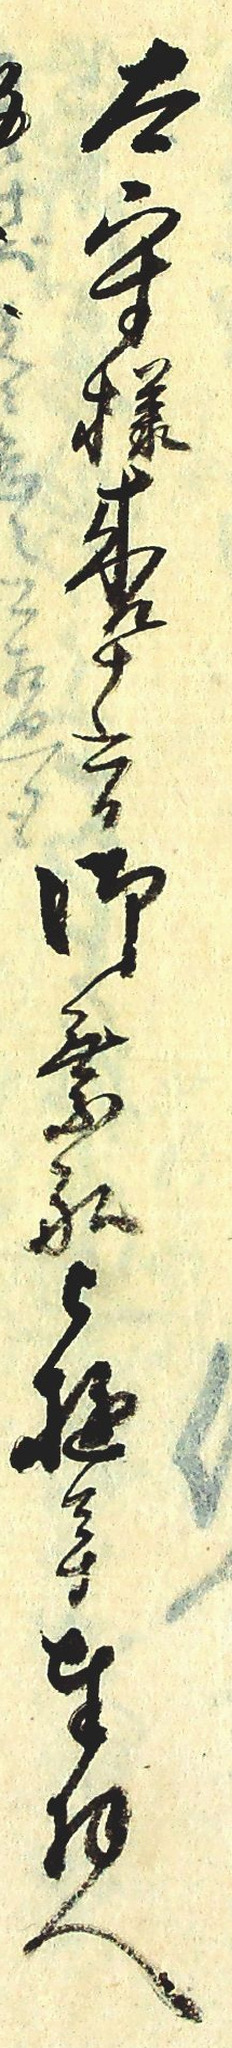太守様来る十六日御乗船被遊候付奉拝人
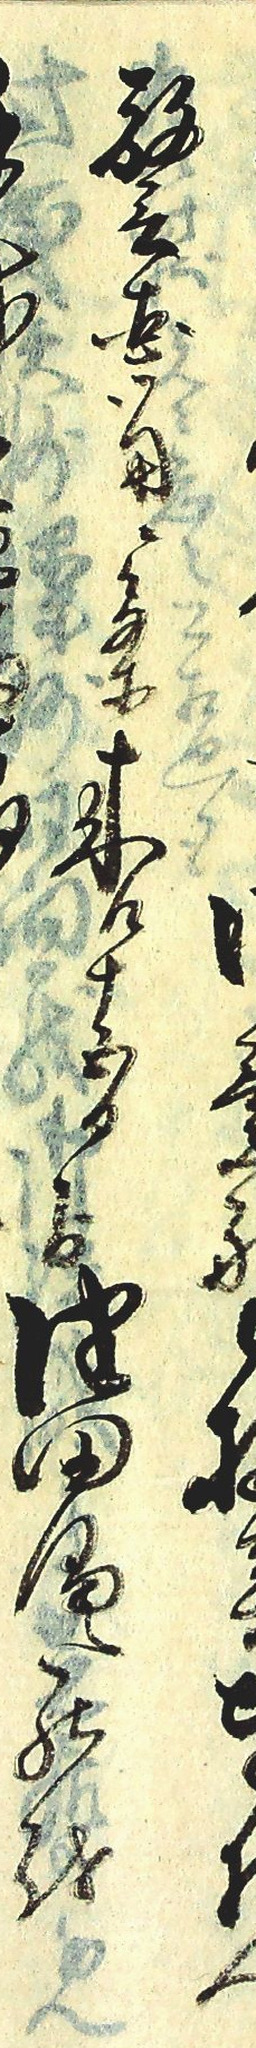警固御用候条来る十五日ゟ津田浦へ罷越
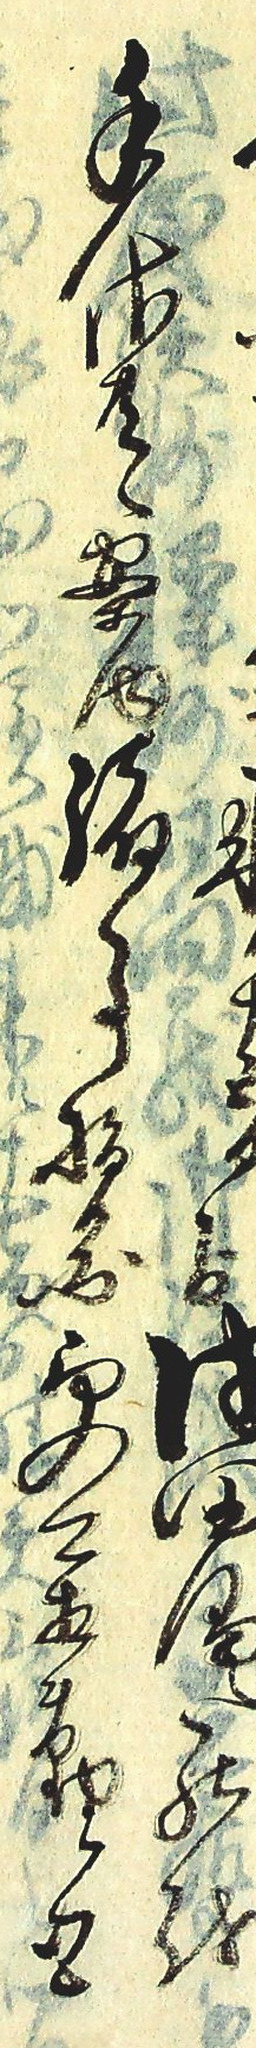手代共へ案内諸事指図受可相勤候以上
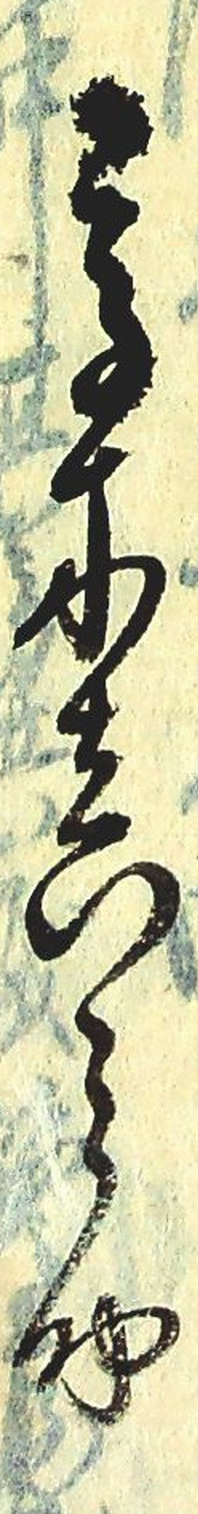高木真之助
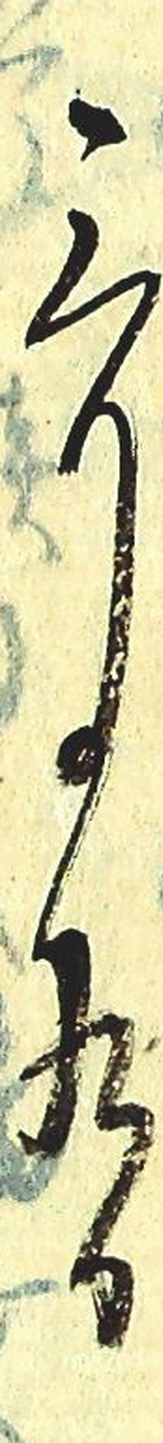三月九日
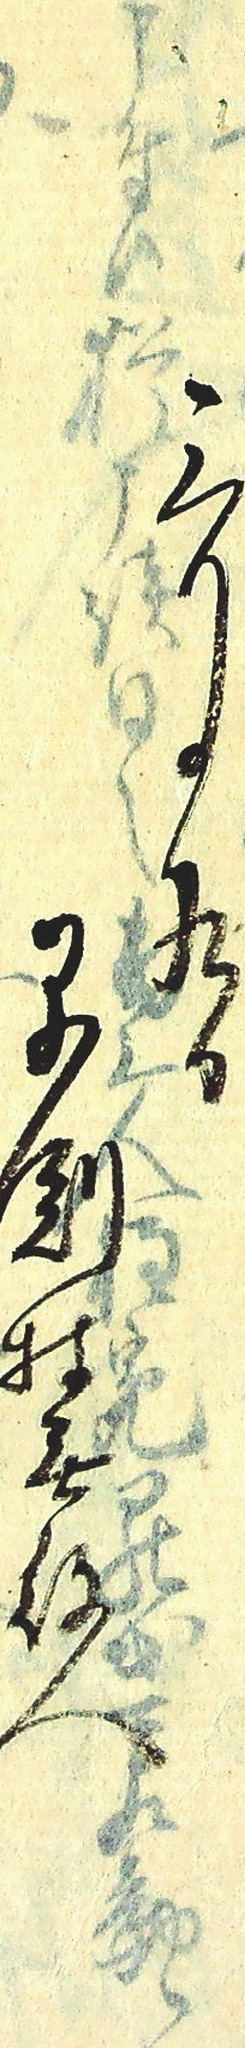早渕村無役人
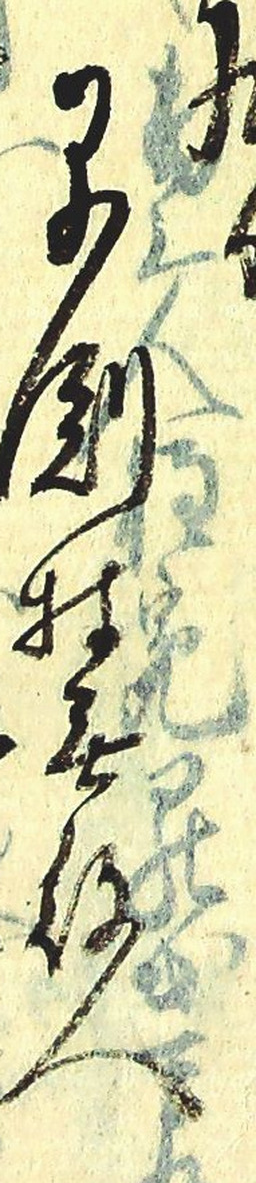早渕村無役人
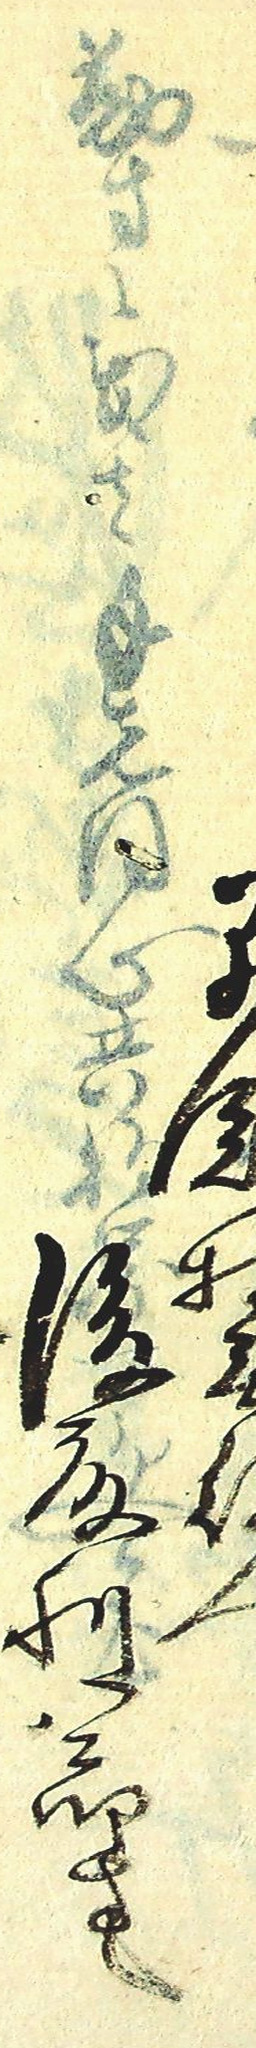後藤利八郎方へ
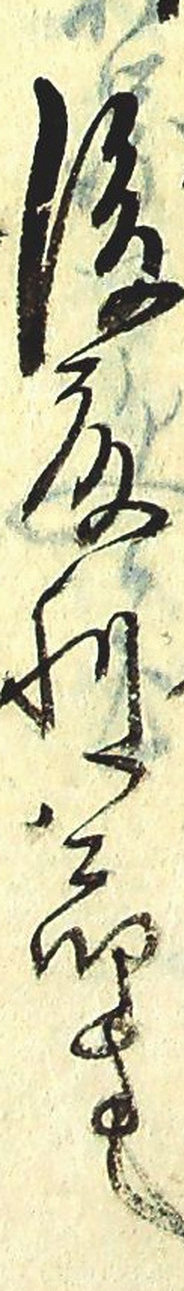後藤利八郎方へ
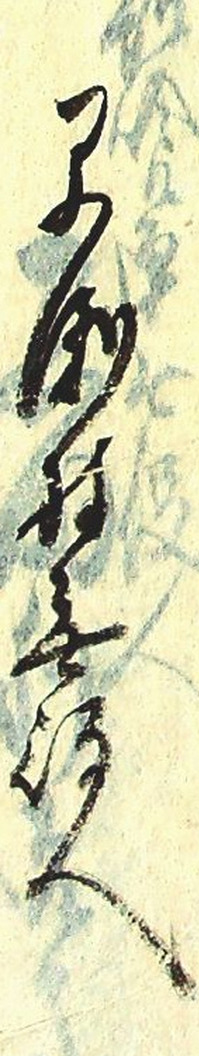早渕村無役人
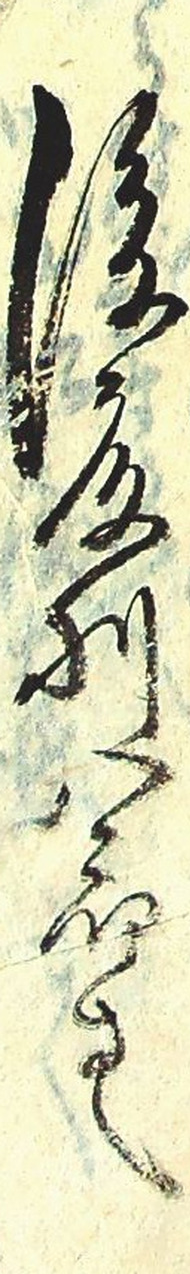後藤利八郎方へ
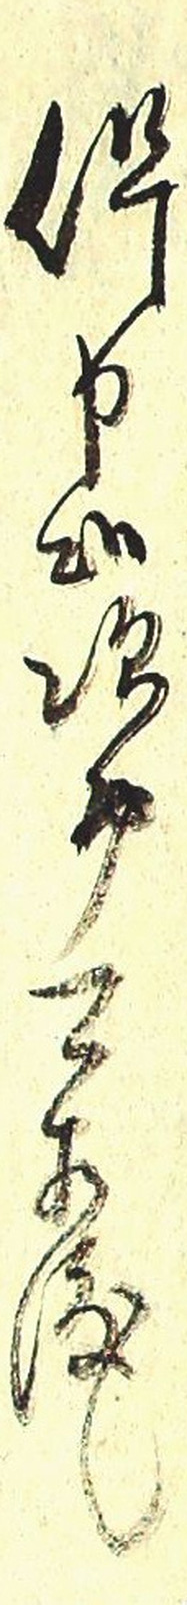但し申出次第可相渡候

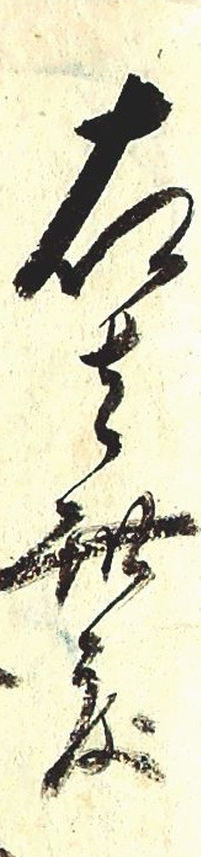右は此度
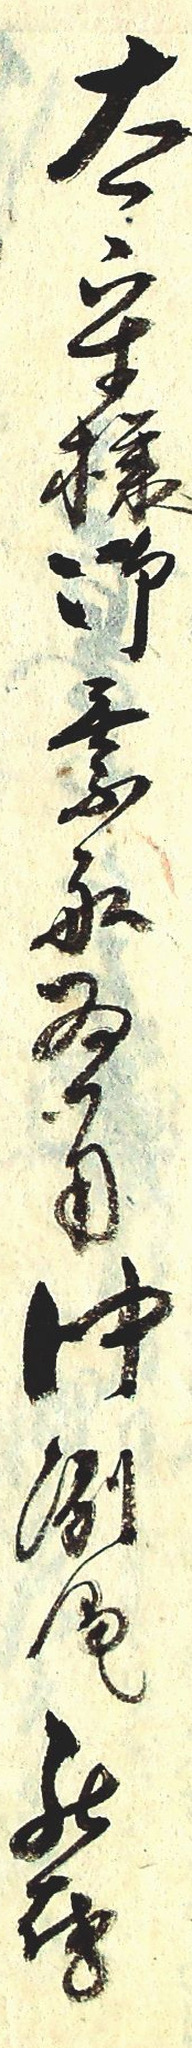太守様御乗船為御用沖洲浦へ罷越候
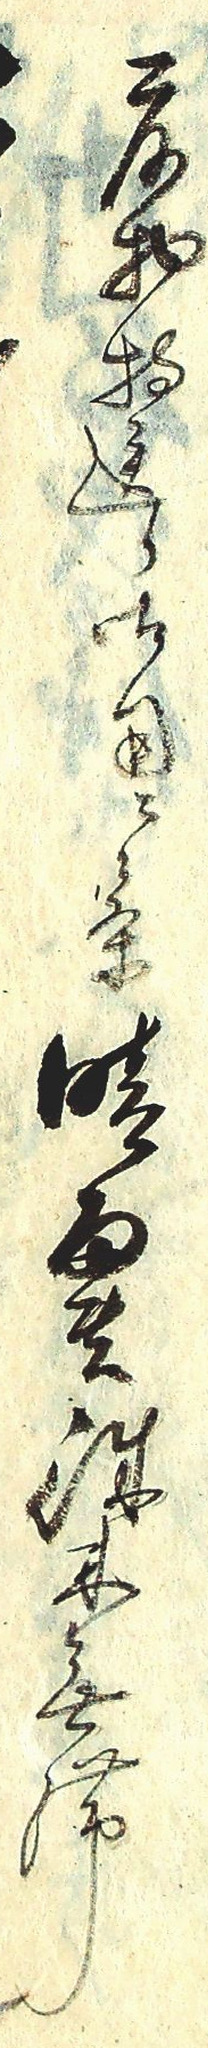荷物指送り御用に候条晴雨共往来無滞
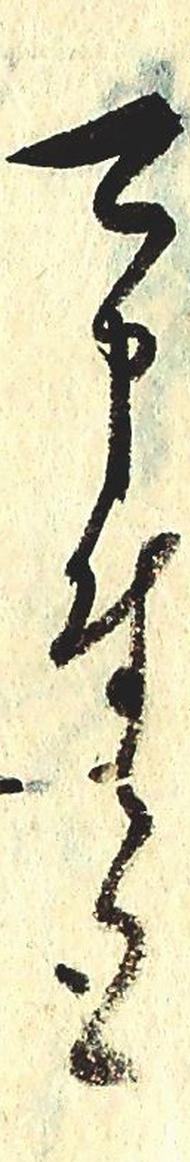可申付候以上
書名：諸御願書控(弐番）
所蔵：鳴門教育大学 Naruto University of Education
